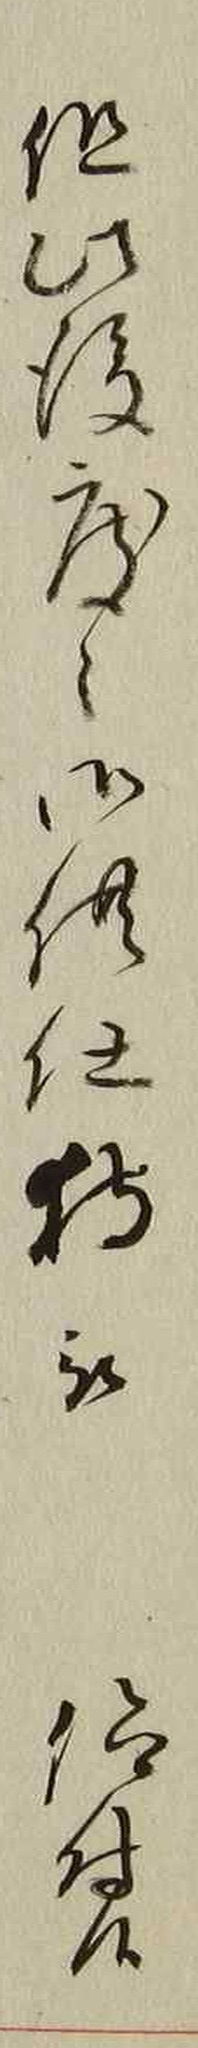但此後度々御供仕狩被仰付候
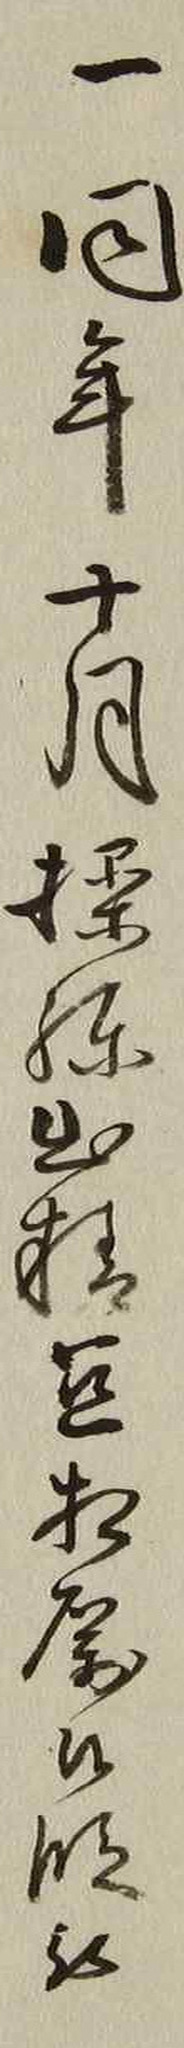一同年十月操練出精宜相属候段被
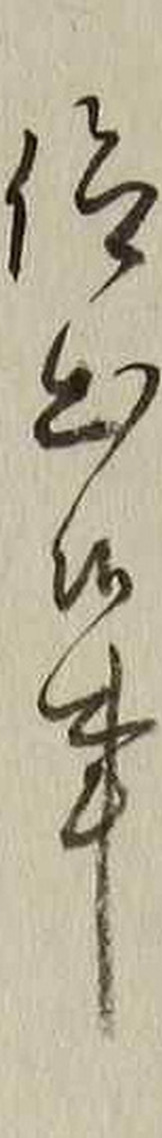仰出候事
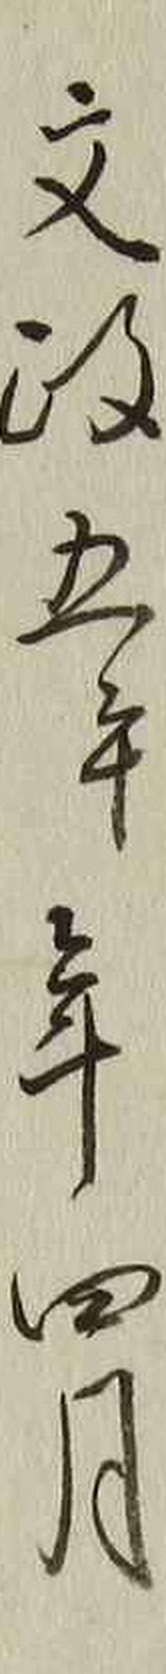文政五午年四月
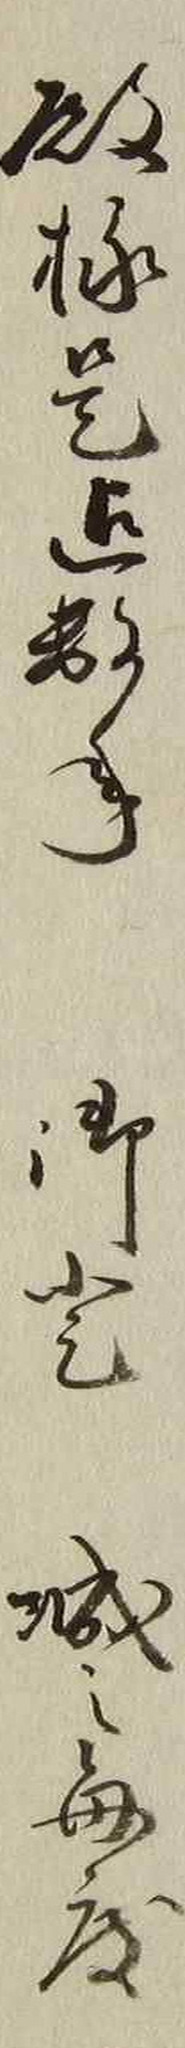殿様是迄数年御登城之毎度
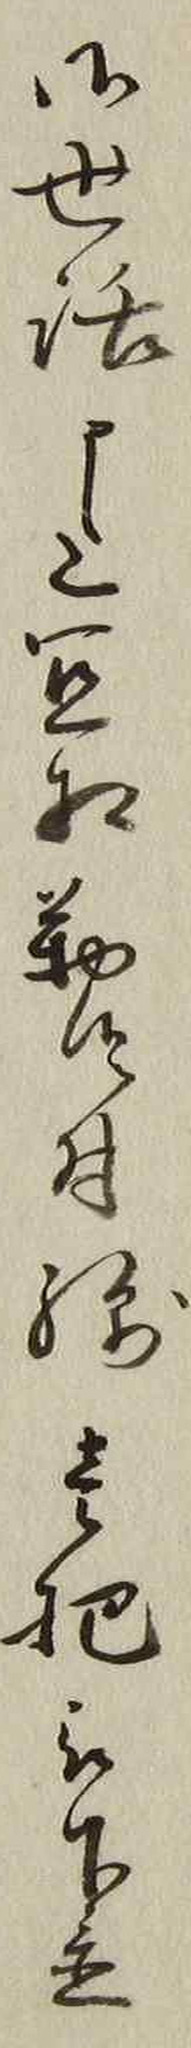御世話申上宜相勤候ニ付綿壱把被下置
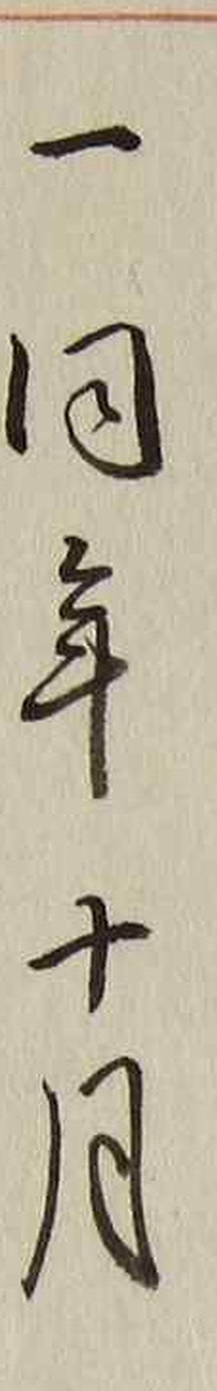一同年十月
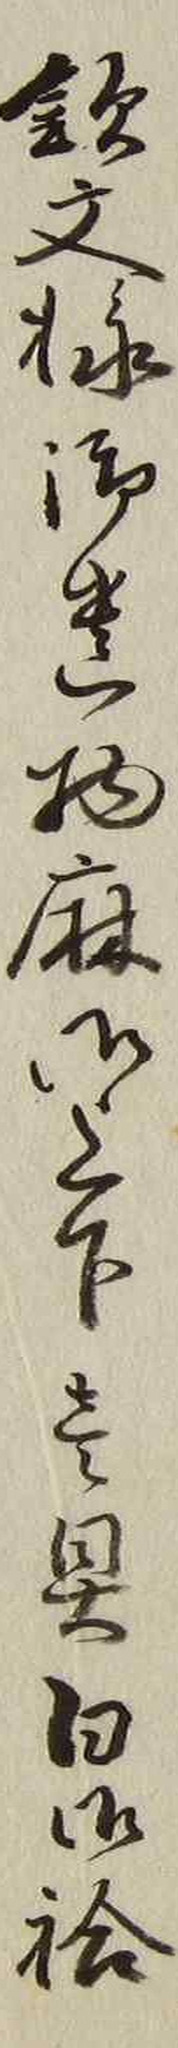欽文様御遺物麻御上下壱具白御袷
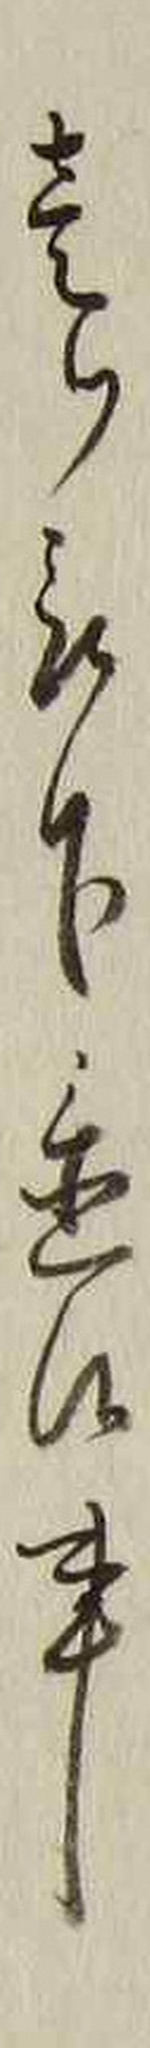壱ツ被下置候事
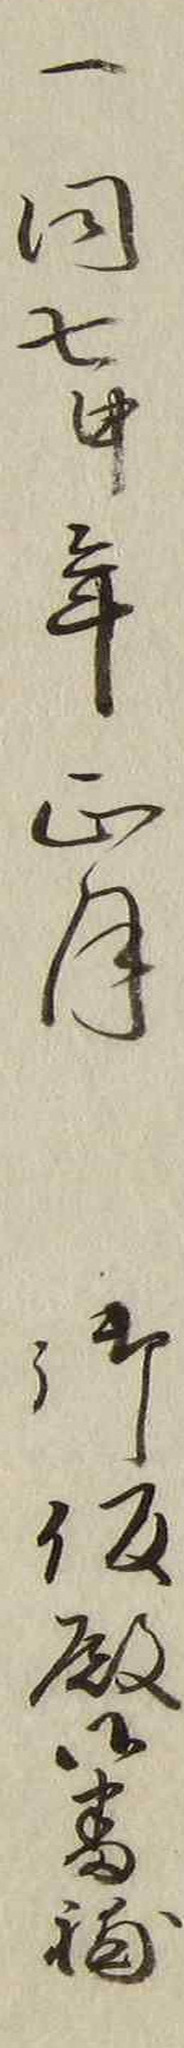一同七申年正月御仮殿御番補

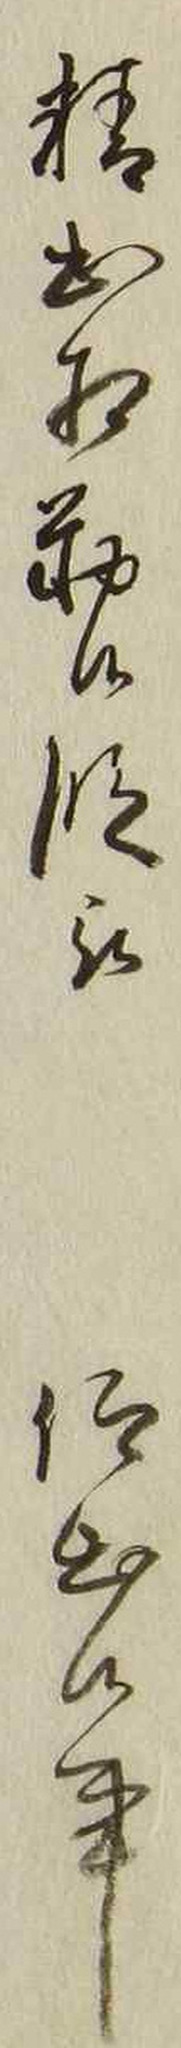精出相勤候段被仰出候事
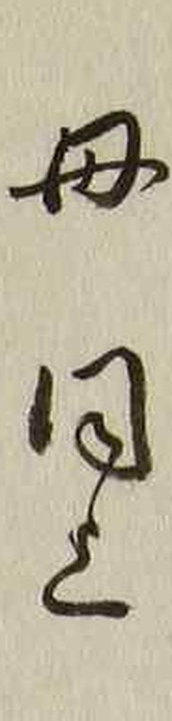母同上
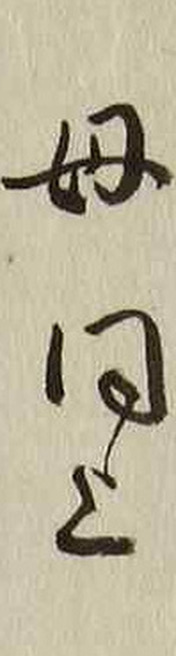母同上
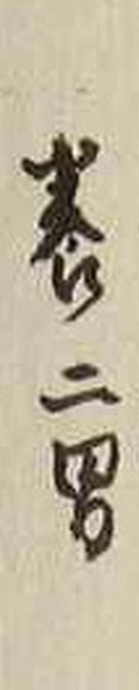養二男
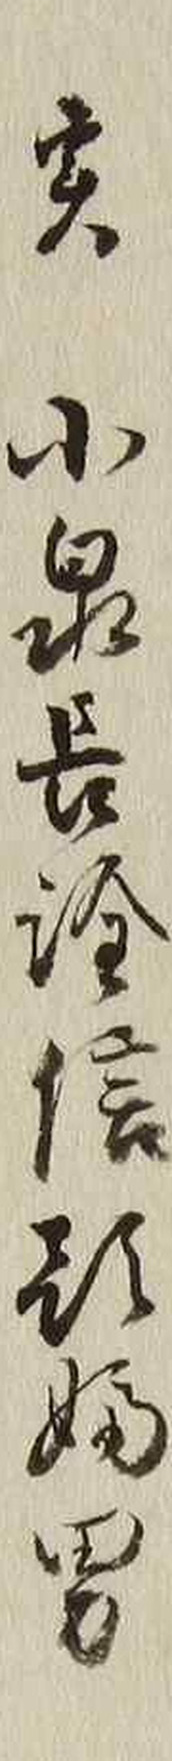実小泉長詮信顕嫡男
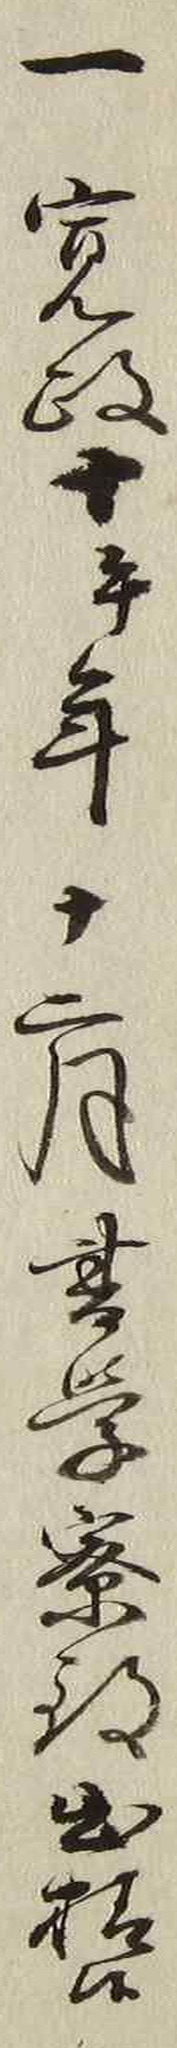一寛政十午年十二月書学寮致出精相勤候
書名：諸士系譜　巻之4　い之部4
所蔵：会津若松市立会津図書館
